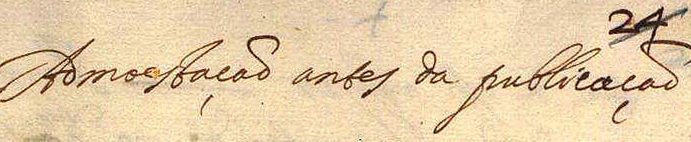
Admoestaçaõ antes da publicaçaõ
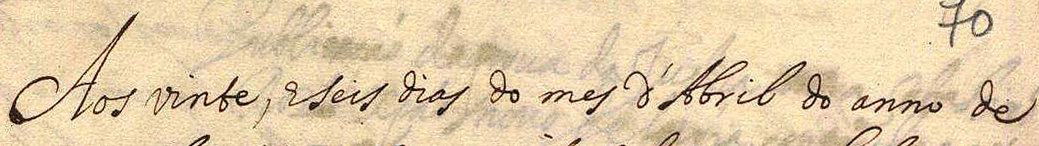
Aos vinte, E seis dias do mes d'Abril do anno de
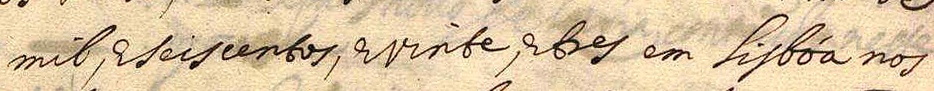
mil, E seiscentos, E vinte, E tres em Lisboa nos
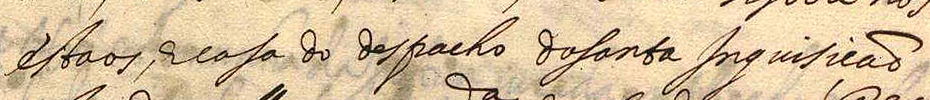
estaos, E casa do despacho da santa Jnquisiçaõ
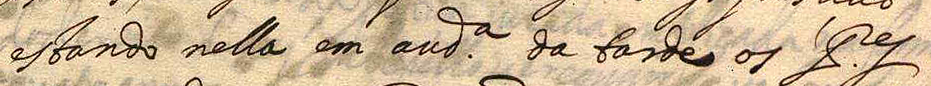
estando nella em aud.a da tarde os s.res
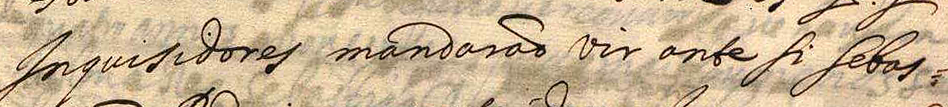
Jnquisidores mandarão vir ante si sebas
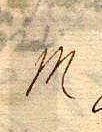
m
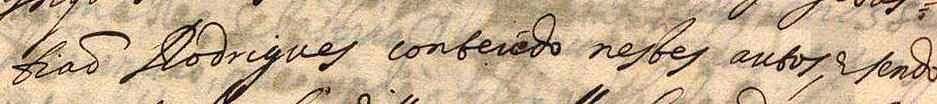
tiaõ Rodrigues conteudo nestes autos, E sendo
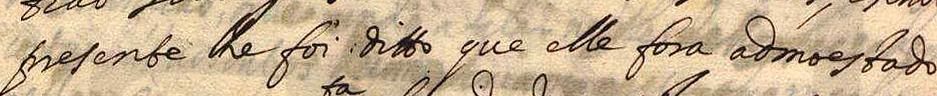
presente lhe foi ditto que elle fora admoestado
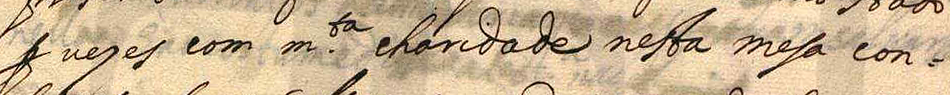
ꝑ uezes com m.ta charidade nesta mesa con
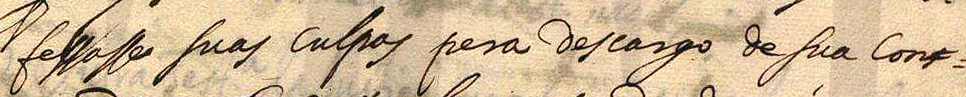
fessasse suas culpas pera descargo de sua cons
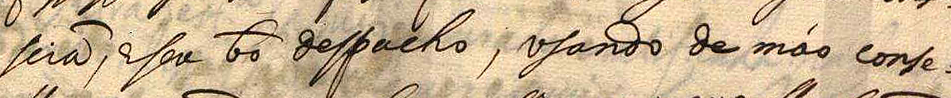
sciā, E seu bō despacho, vsando de máo conse
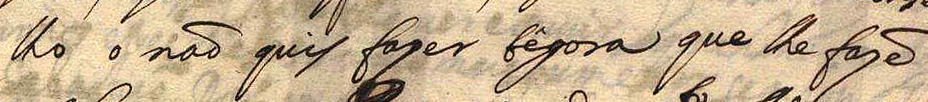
lho o não quis fazer té gora que lhe fazē
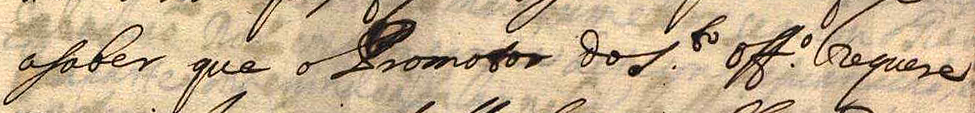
a saber que o Promotor do s.to off.o Requere
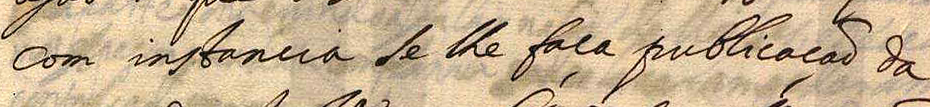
com instancia se lhe faça publicaçaõ da
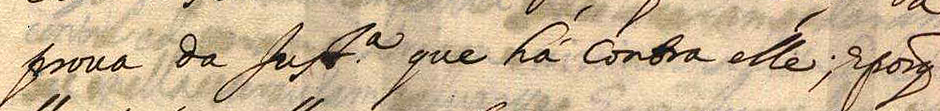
proua da Just.a que há contra elle; E porq̄
